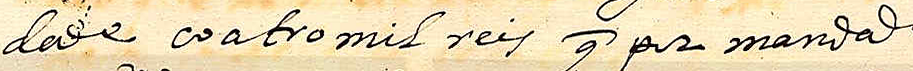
dade coatro mil reis q̄ por mandado
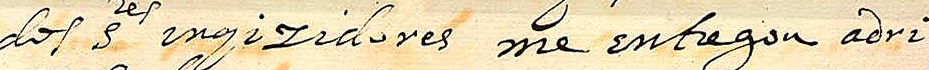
dos sres inqizidores me Entregou adri
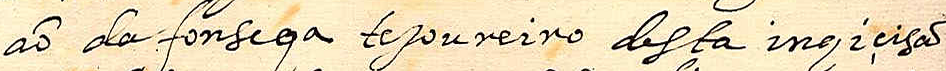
aõ da fonseqa tezoureiro desta inqiçisaõ
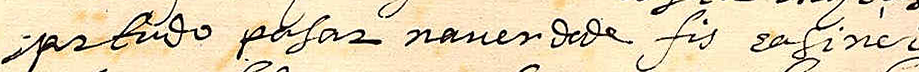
E por tudo pasar na uerdade fis E asinei
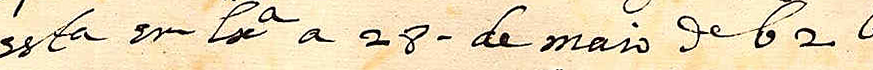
Esta Em lxa a 28 - de maio de 626
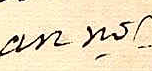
annos
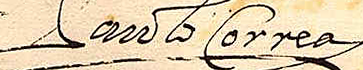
Paulo Correa
